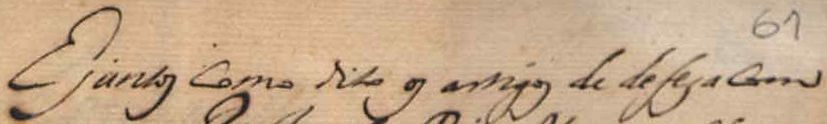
E juntos como dito os artigos de defeza com
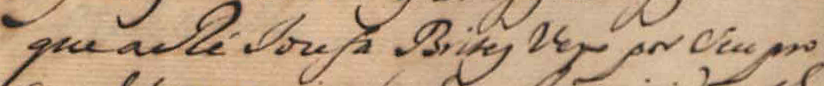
que a Ré Iozefa Brites veyo por seu pro
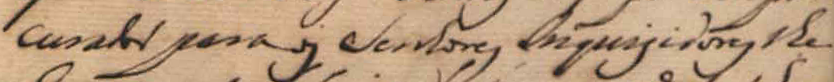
curador pera os Senhores Inquizidores lhe
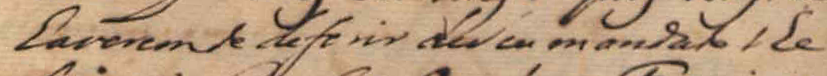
haverem de deferir de seu mandado lhe
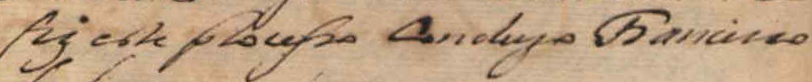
fiz este pRocesso Concluzo Francisco
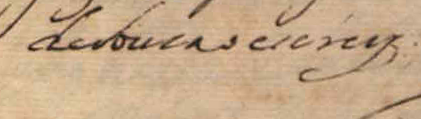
de souza o escreuj
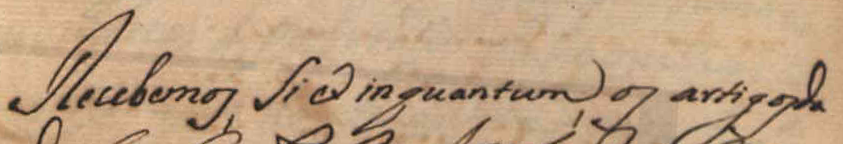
Recebemos, si et in quantum os artigos da
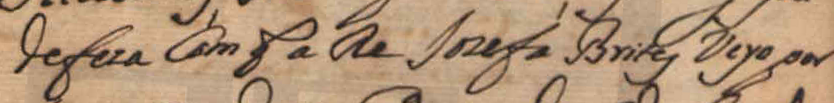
defeza Com q̄ a Re Jozefa Brites veyo por
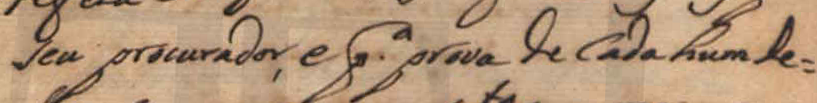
seu procurador, e p.a prova de Cada hum de
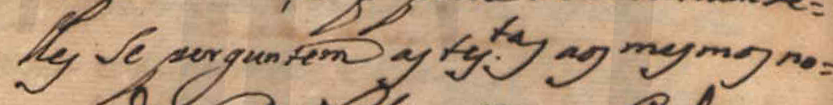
lles se perguntem as tes.tas aos mesmos no
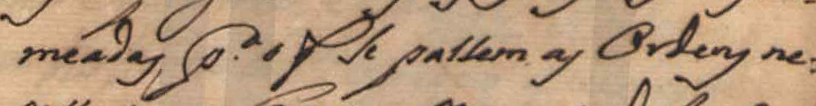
meadas p.a o q̄ se passem as Ordens ne
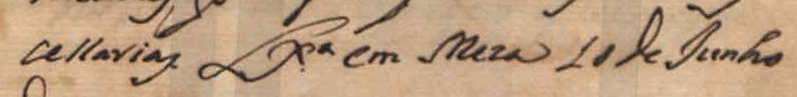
cessarias Lx.a em Meza 10 de Iunho
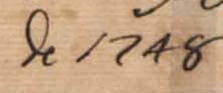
de 1748
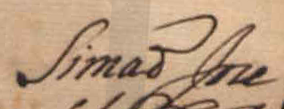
Simaõ Joze
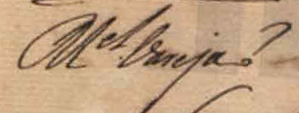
M.el Varejaõ
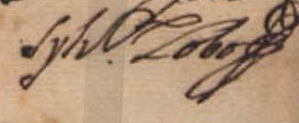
Syl.o Lobo
